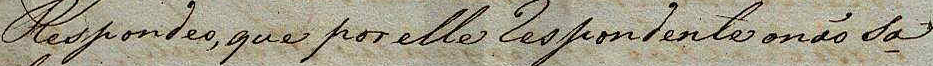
Respondeo, que por elle respondente o naõ sa
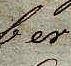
ber.
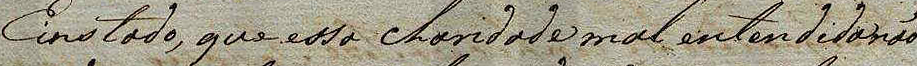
E instado, que essa charidade mal entendida naõ
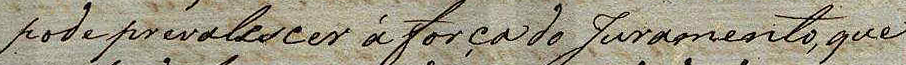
pode prevalescer à força do Juramento, que
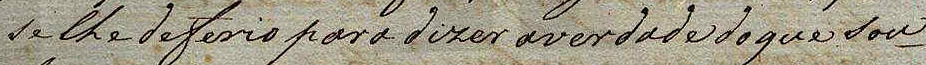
se lhe deferio para dizer a verdade do que sou
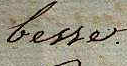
besse.
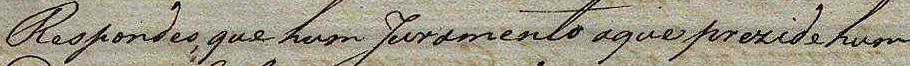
Respondeo, que hum Juramento a que prezide hum
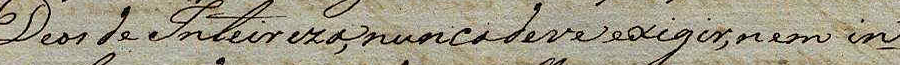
Deos de Inteireza, nunca deve exigir, nem in
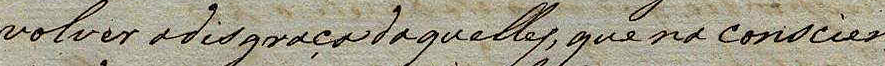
volver a disgraça daquelles, que na conscien
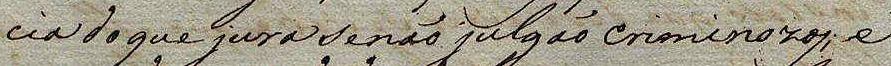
cia do que jura senaõ julgaõ criminozos; e
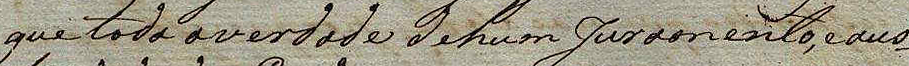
que toda a verdade de hum Juramento, e aus
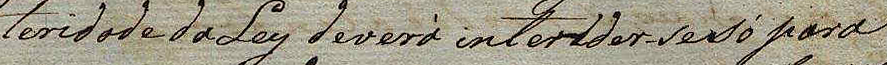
teridade da Ley deverà intender-se só para
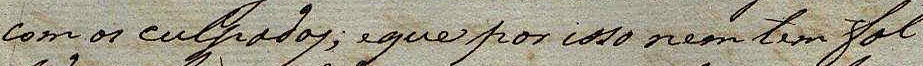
com os culpados; e que por isso nem tem fal
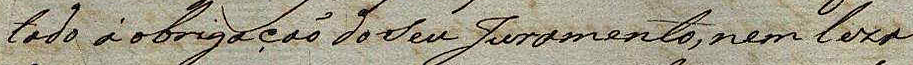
tado à obrigaçaõ do seu Juramento, nem leza
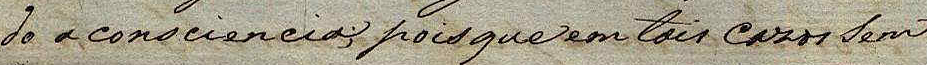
do a consciencia; pois que em tais cazos sem
